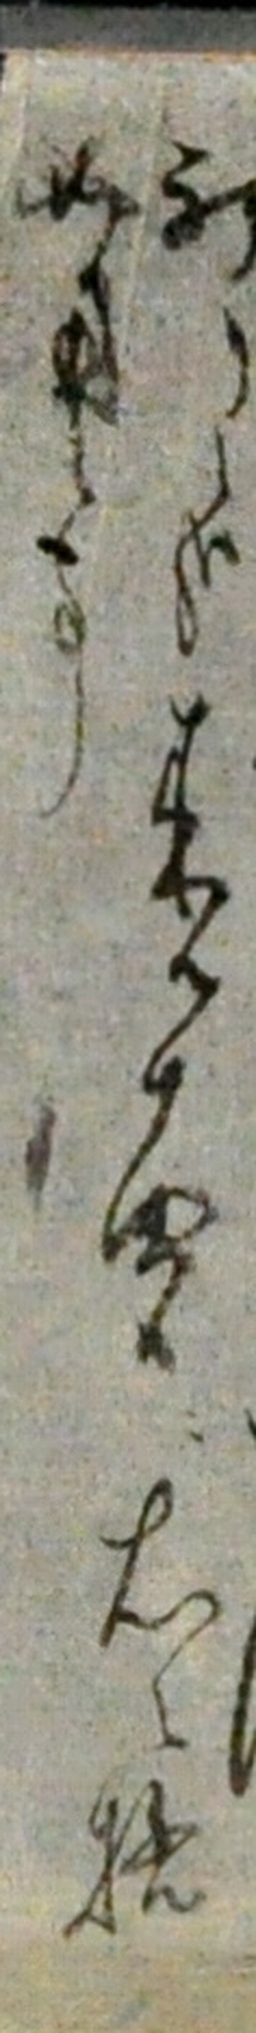御用之事
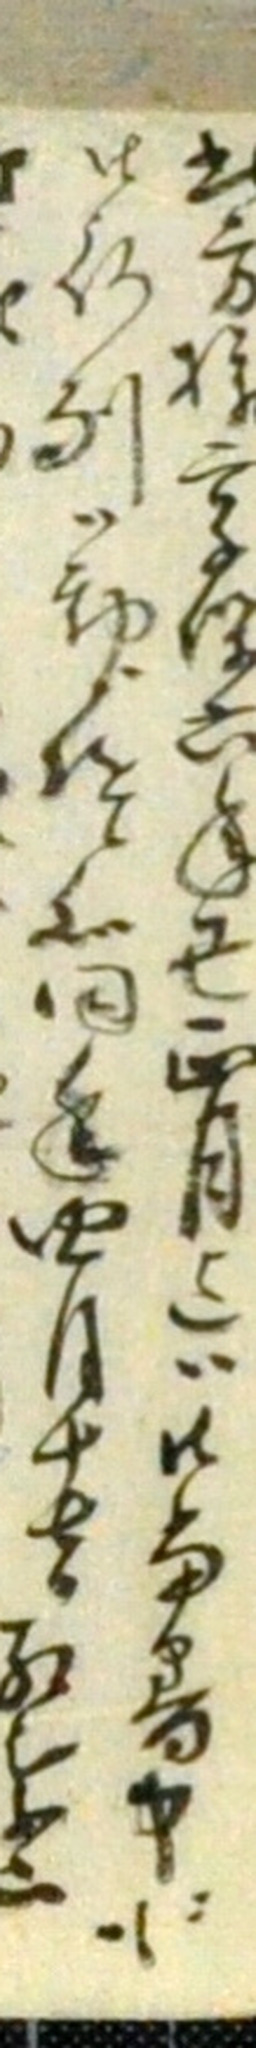御行列御勤被遊候処同年四月十七日紅葉山
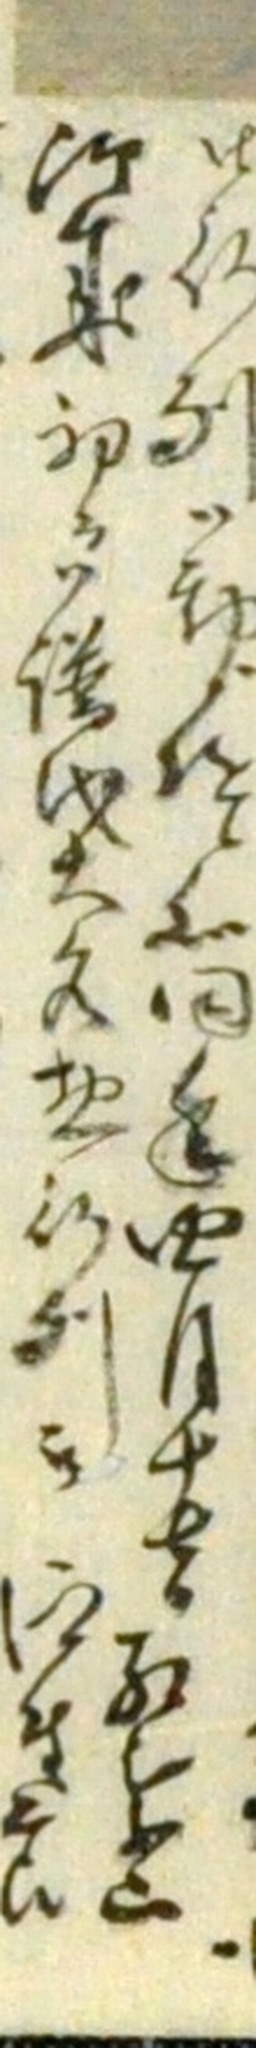御成初而御譜代大名惣行列被仰付候節
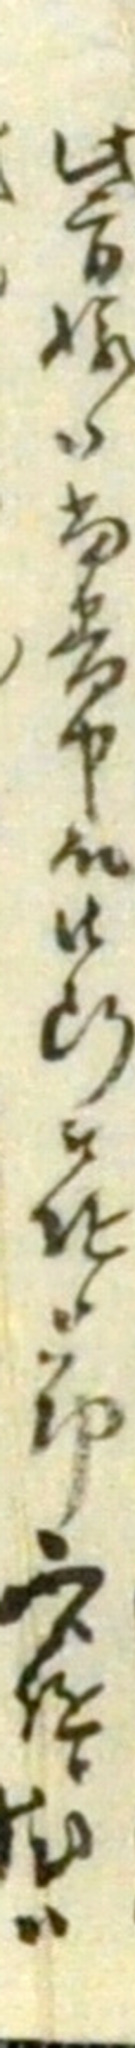此方様御当番中故御断被遊御勤不被遊候然ハ
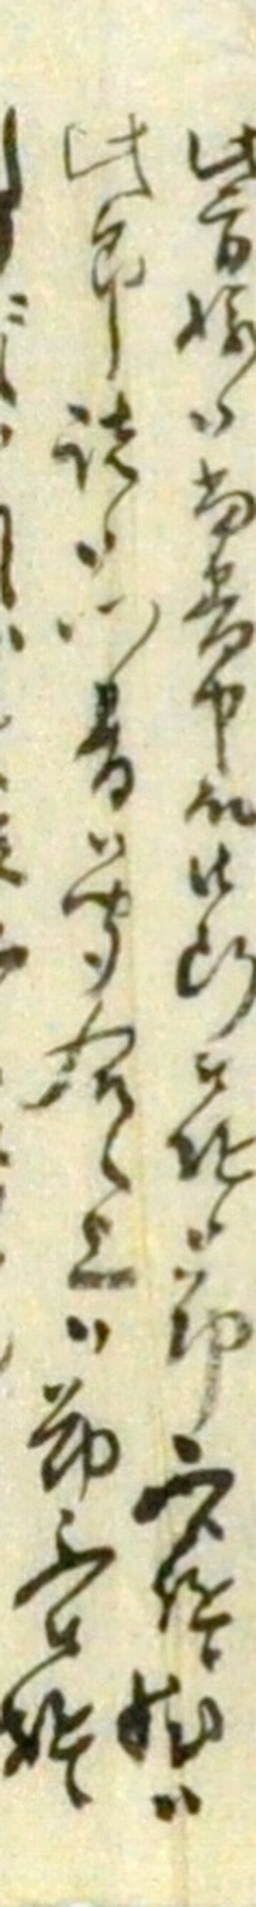此節諸御門番御聞合之上御勤不被遊候
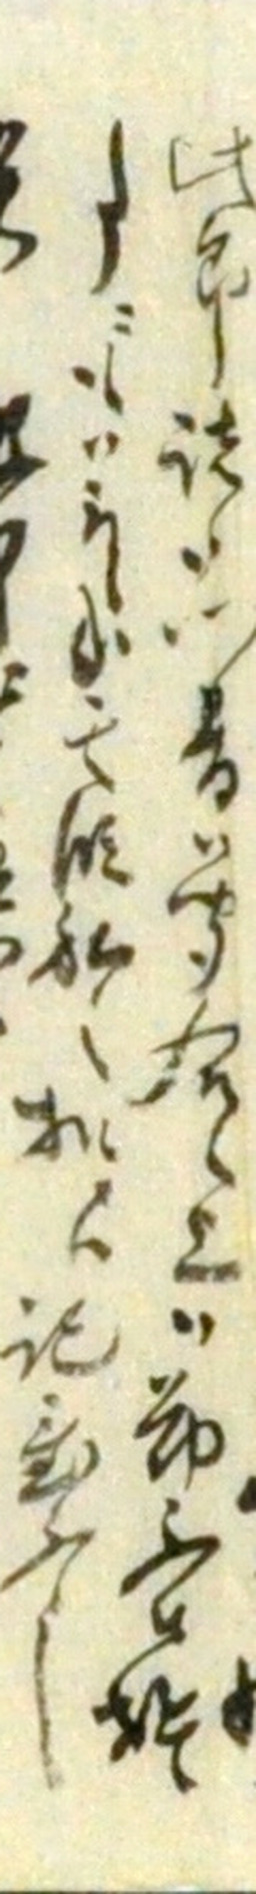事ニも御座候哉其段私之扣ニハ記置不申候
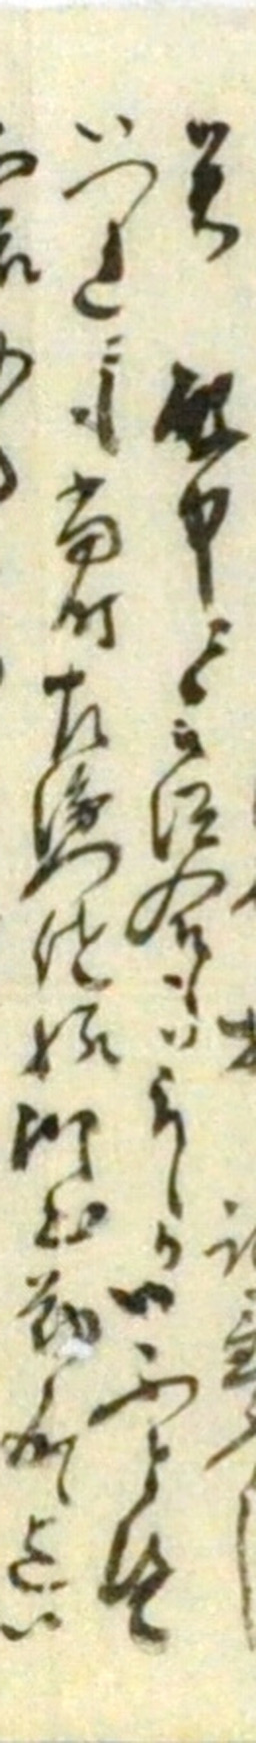いつれニも当時左衛門佐様御出勤被成候迄ハ
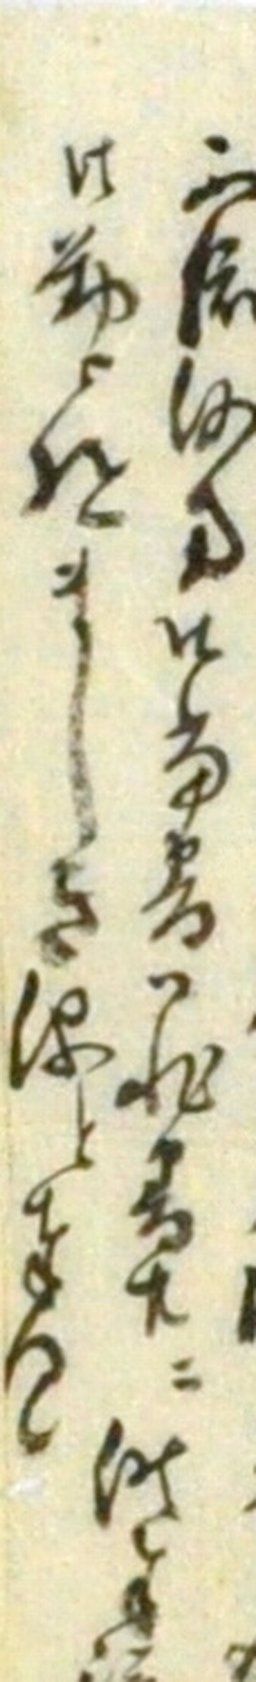御勤被遊ましき儀と奉存候
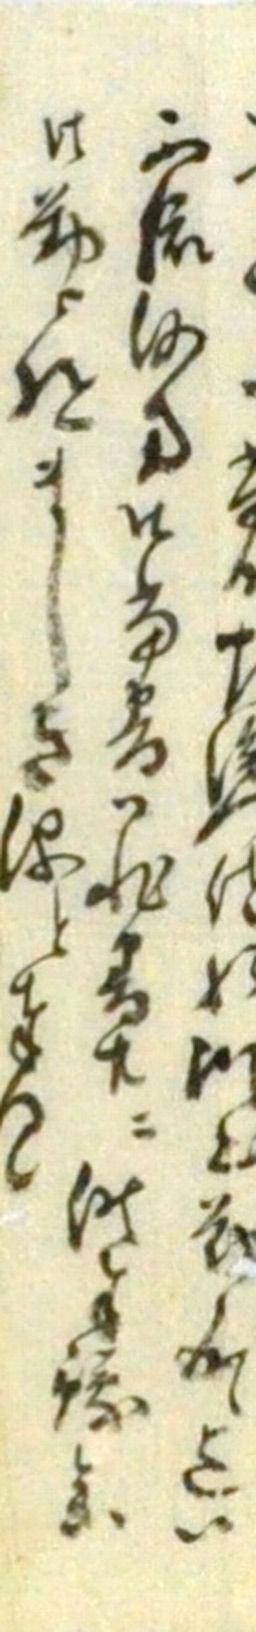御勤被遊ましき儀と奉存候
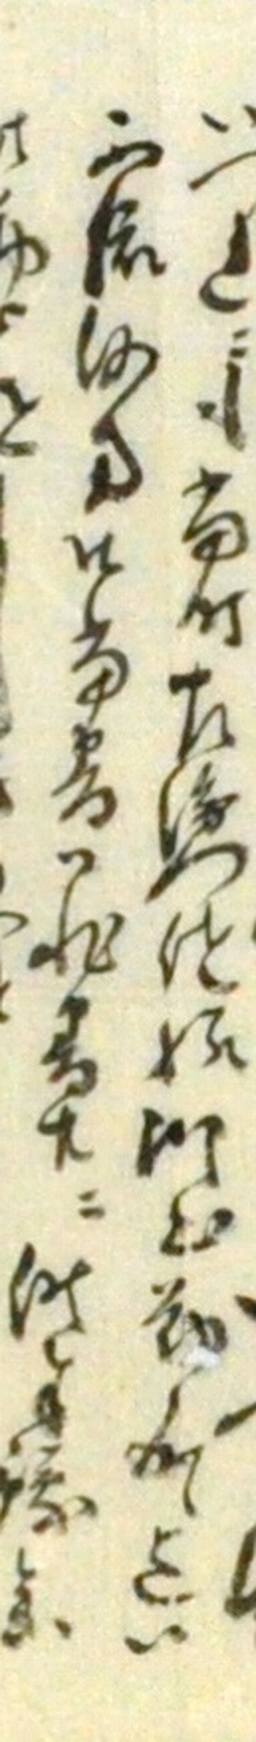不依何方御当番御非番共ニ供奉予参
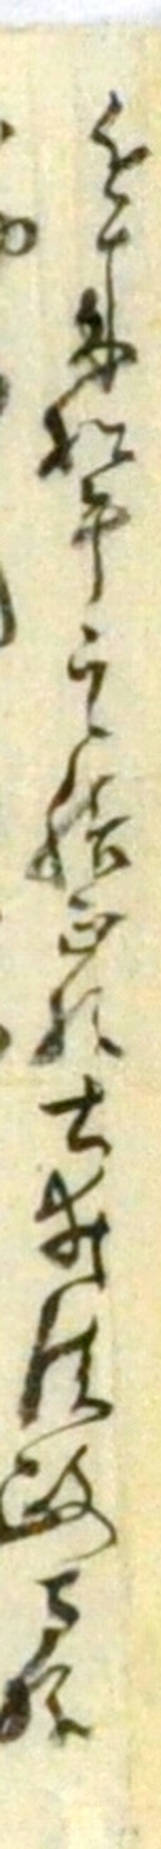近来松平主膳正様土井淡路守様
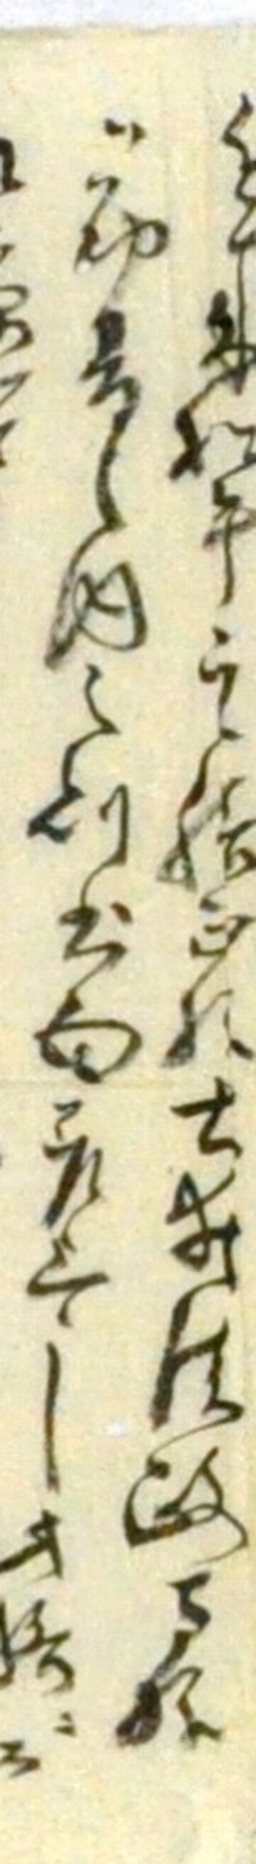御勤番之内之則書面差上申候此格ニ而
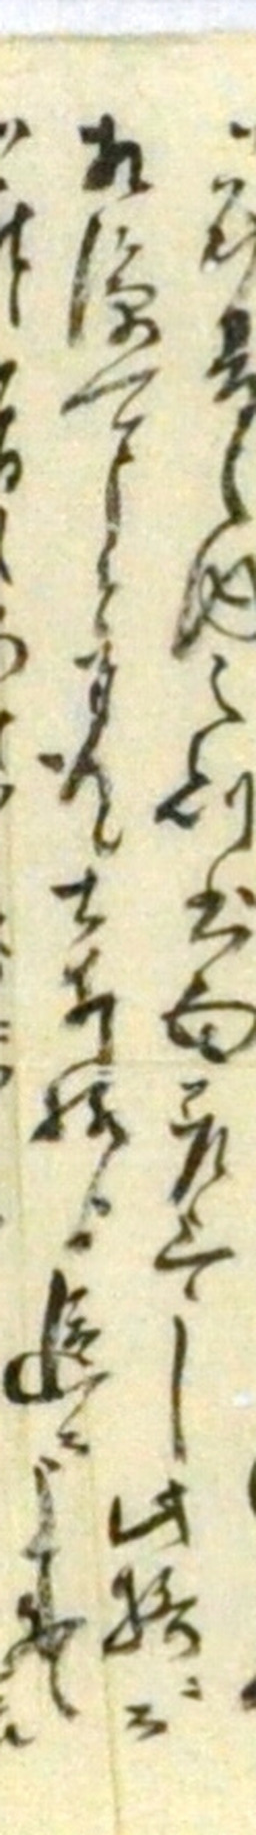相障可申と奉存候土井様ゟ追而申来候覚
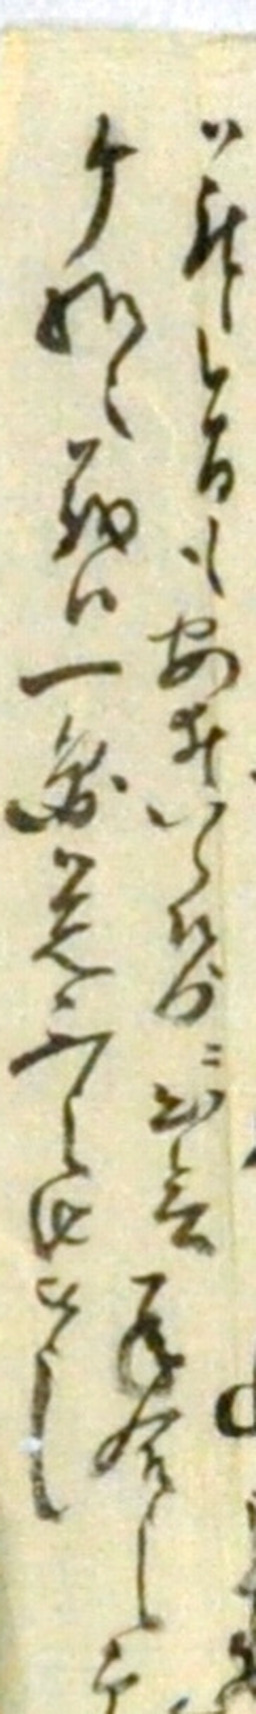ケ様之義ハ一円覚不申由被申候
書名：覚
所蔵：伊那市立高遠町図書館・合同会社AMANE
